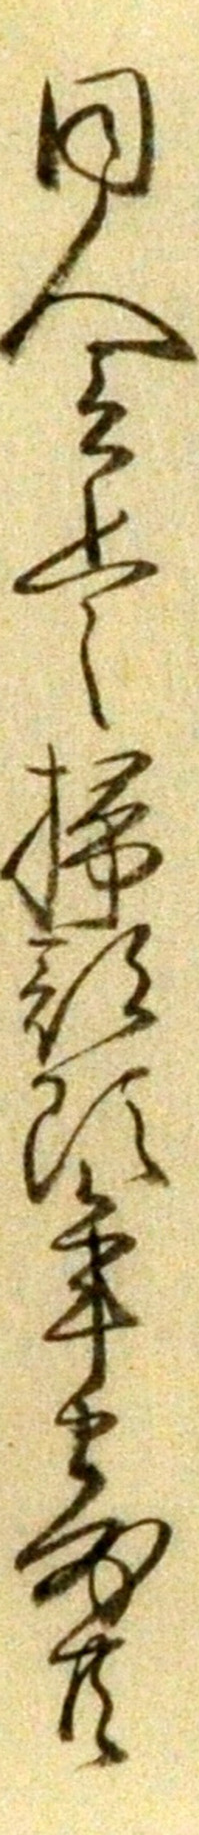同人言上之掃部頭年寄共
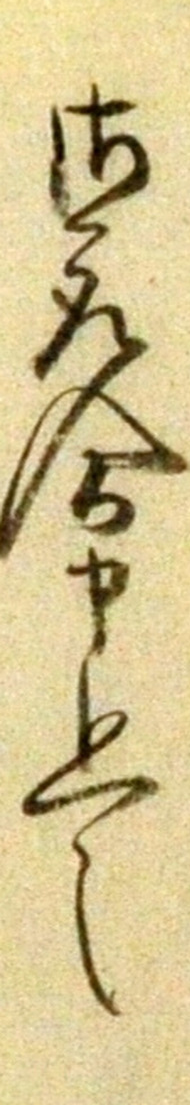御取合申上之
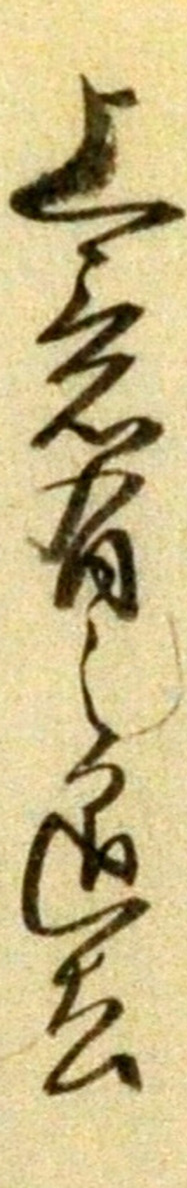上意有之退去
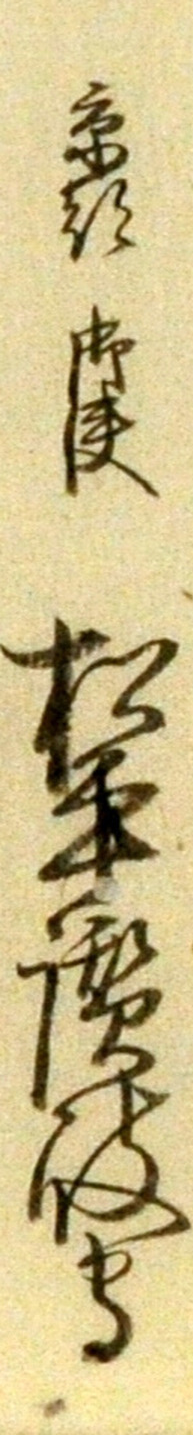京都御使松平讃岐守
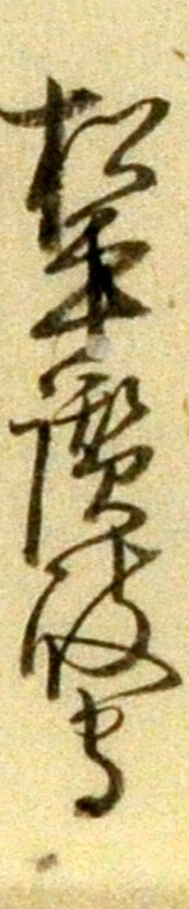松平加賀守
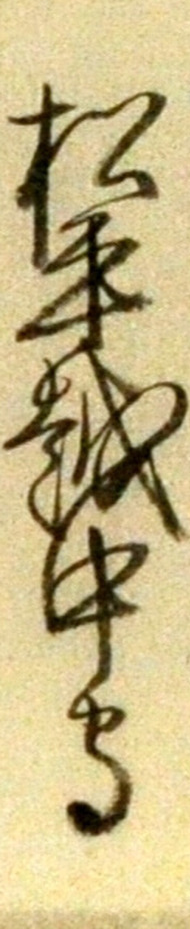松平越中守
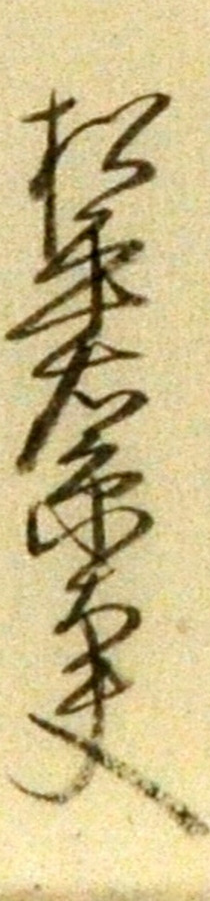松平右京大夫

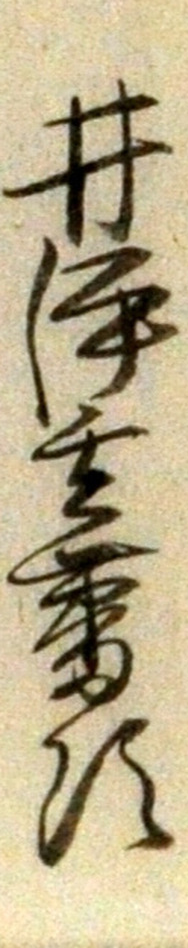井伊玄蕃頭
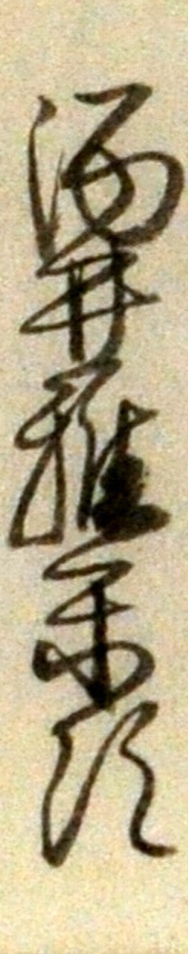酒井雅楽頭
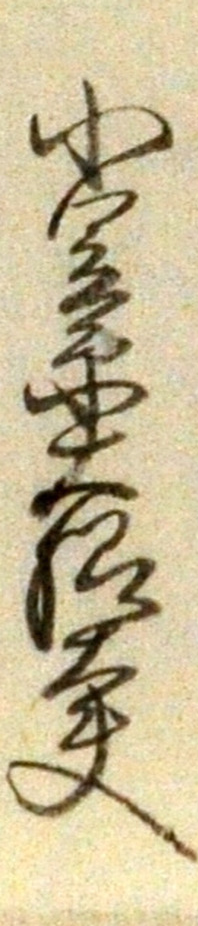小笠原大膳大夫
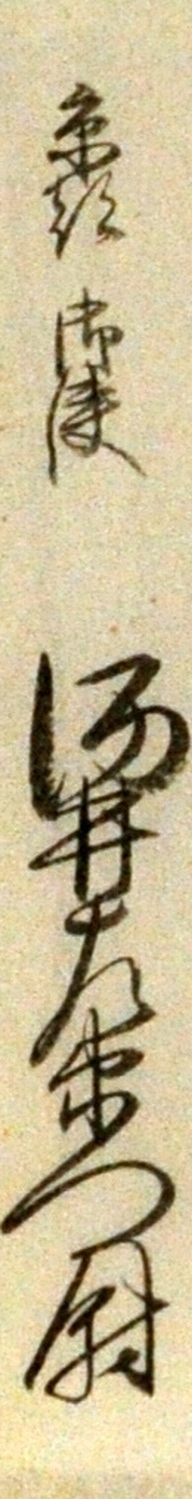京都御使酒井左衛門尉
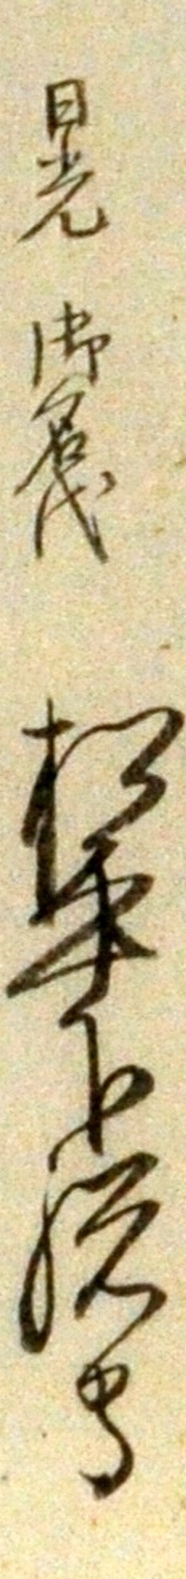日光御名代松平下総守
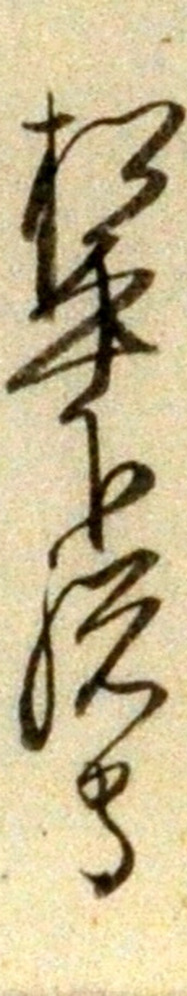松平近江守
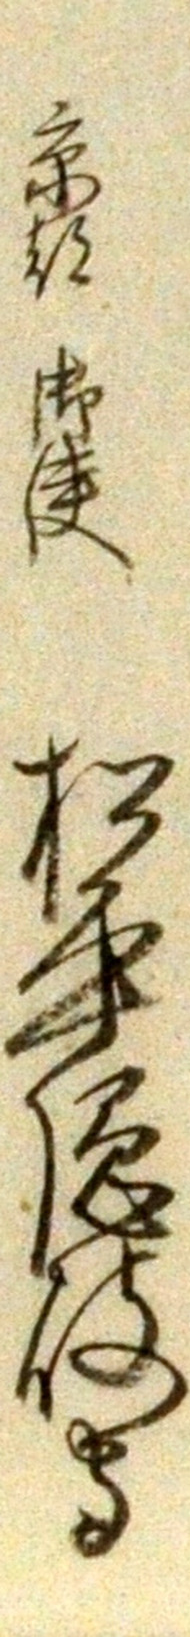京都御使松平隠岐守
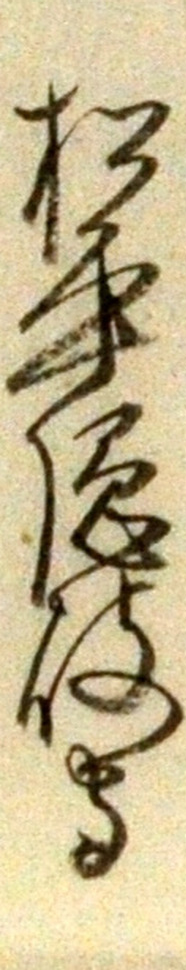松平近江守
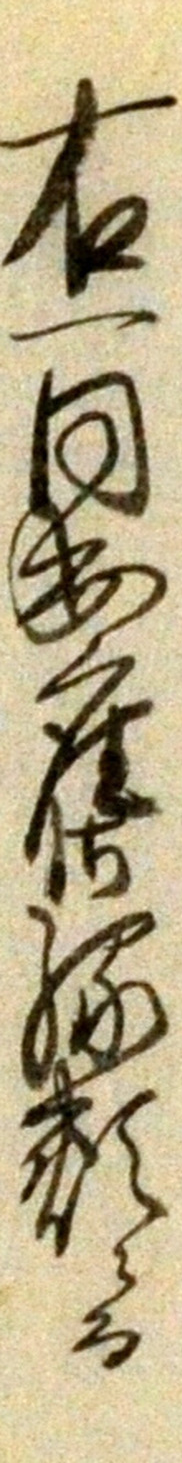右一同出座御縁頬ニ而
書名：御馳走御能ノ節ノ留外
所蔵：伊那市立高遠町図書館・合同会社AMANE
